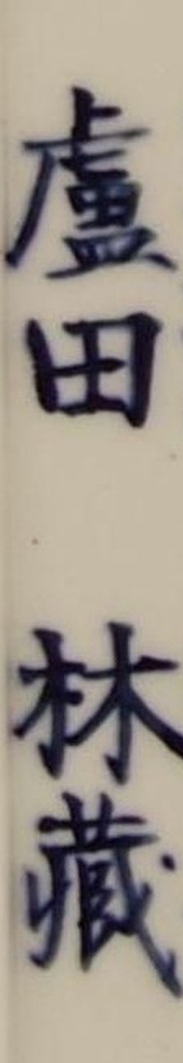盧田林蔵

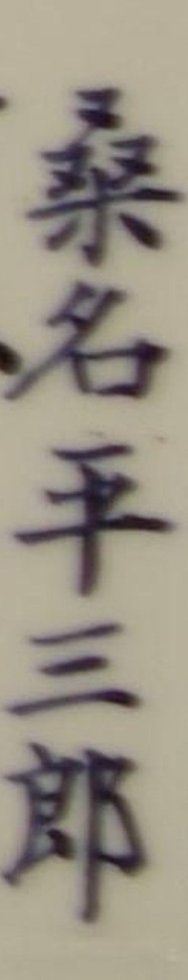桑名平三郎
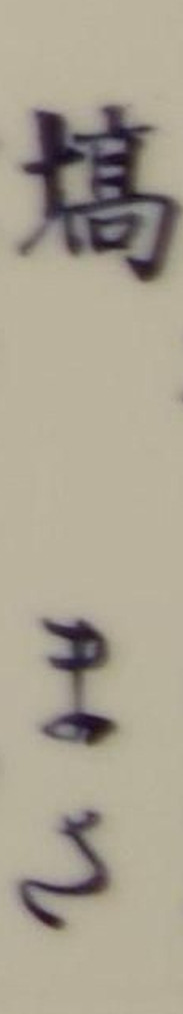塙まさ
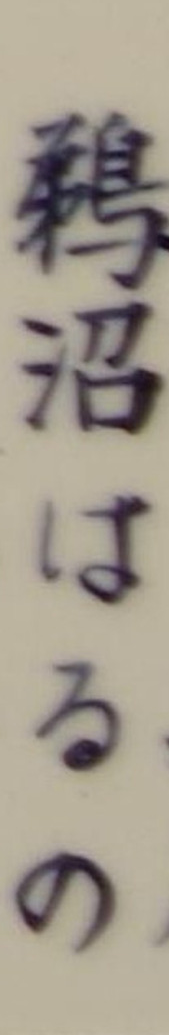鵜沼はるの
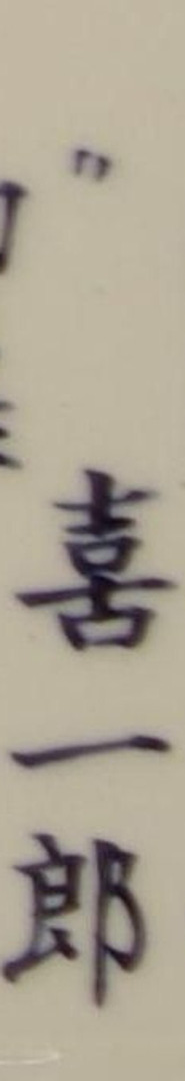喜一郎
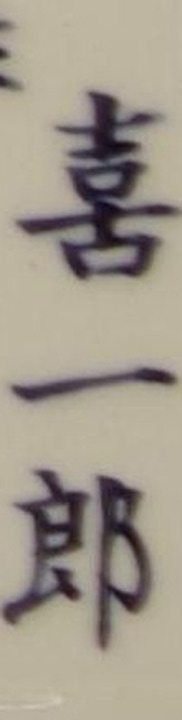喜一郎
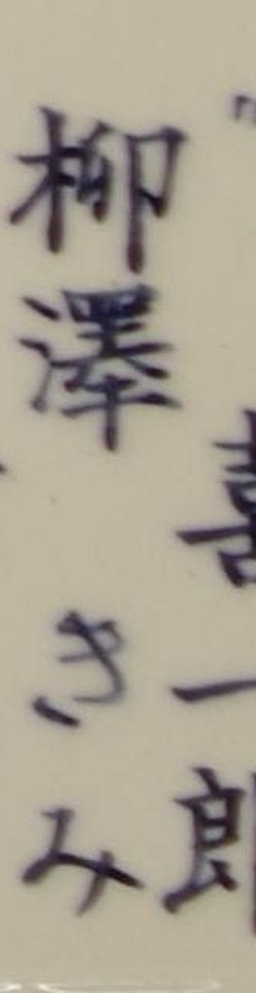柳澤きみ
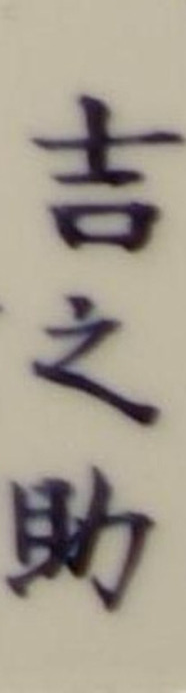吉之助
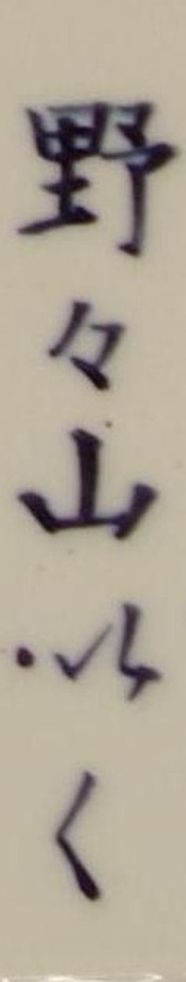野々山いく
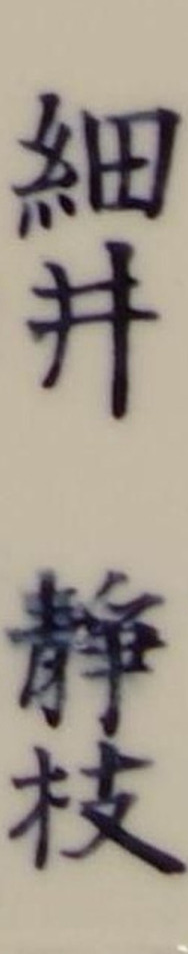細井静枝
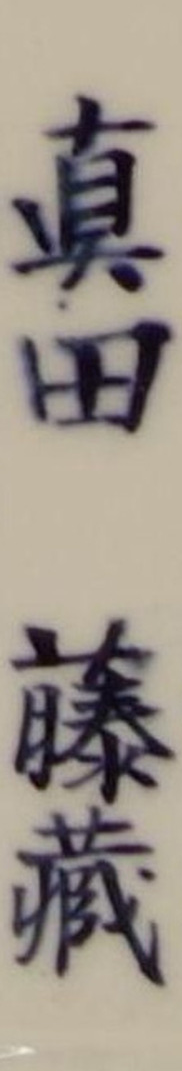真田藤蔵
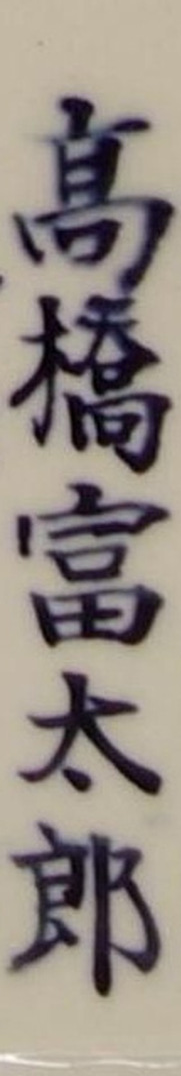高橋富太郎
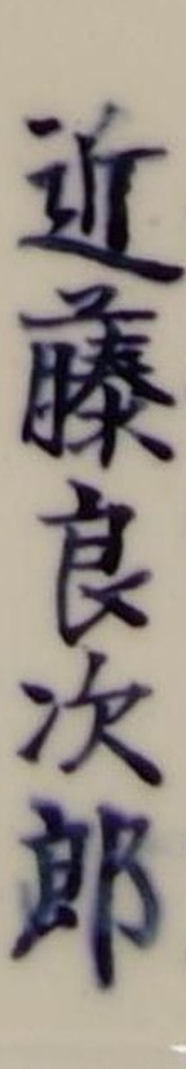近藤良次郎
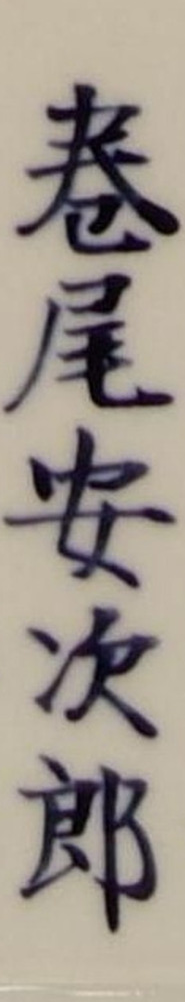巻尾安次郎
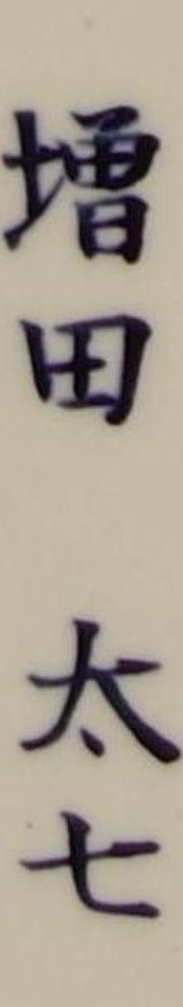増田太七
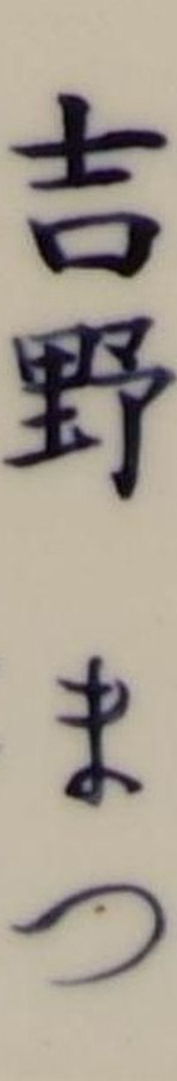吉野まつ
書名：E~L
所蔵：高野山金剛峯寺
